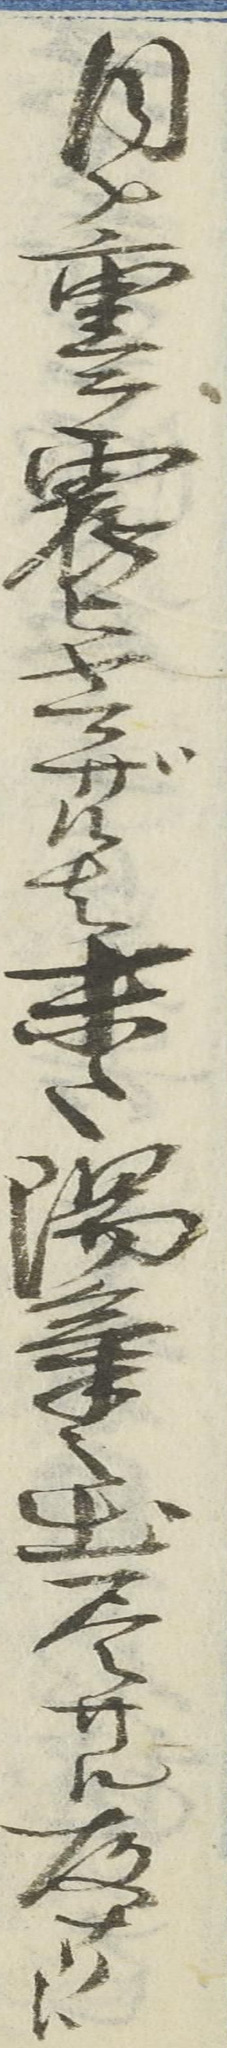月ヲ重テ震ヒヤマザルハ未タ陽氣之出尽サル故ナリト
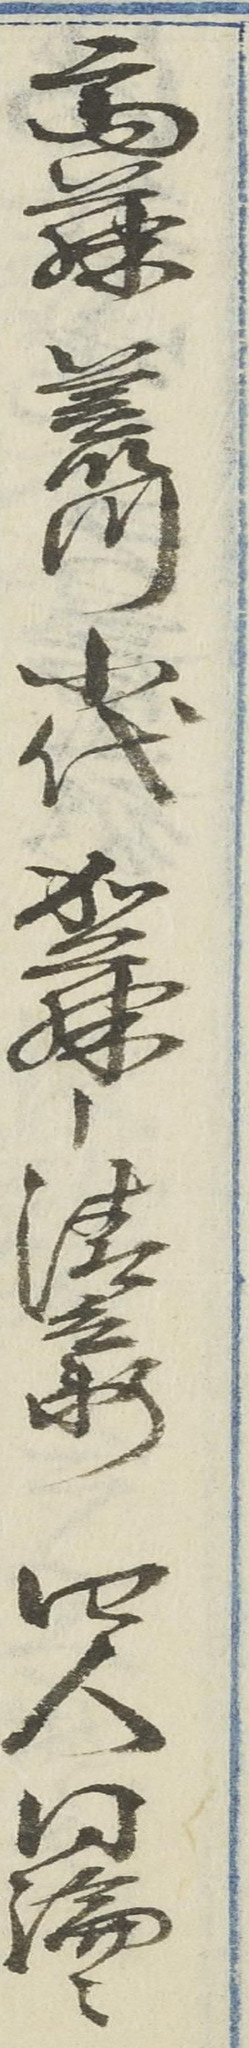髙藤荒川小代加藤ノ清兵衛四人同論之
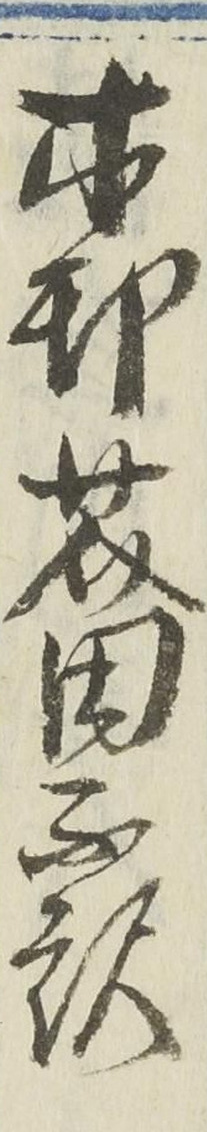木邨芥田不訳
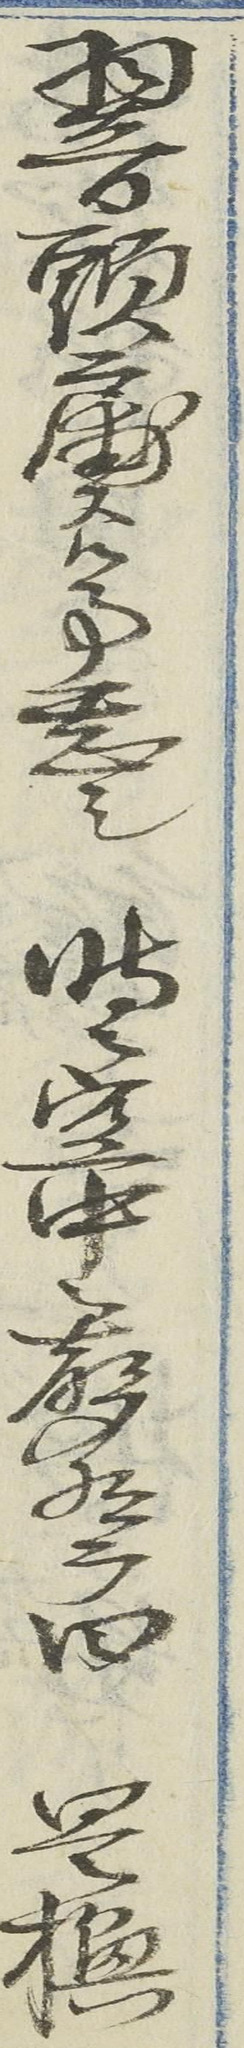翌日頭痛スル事甚シ時ニ空中ニ聲有テ曰是換
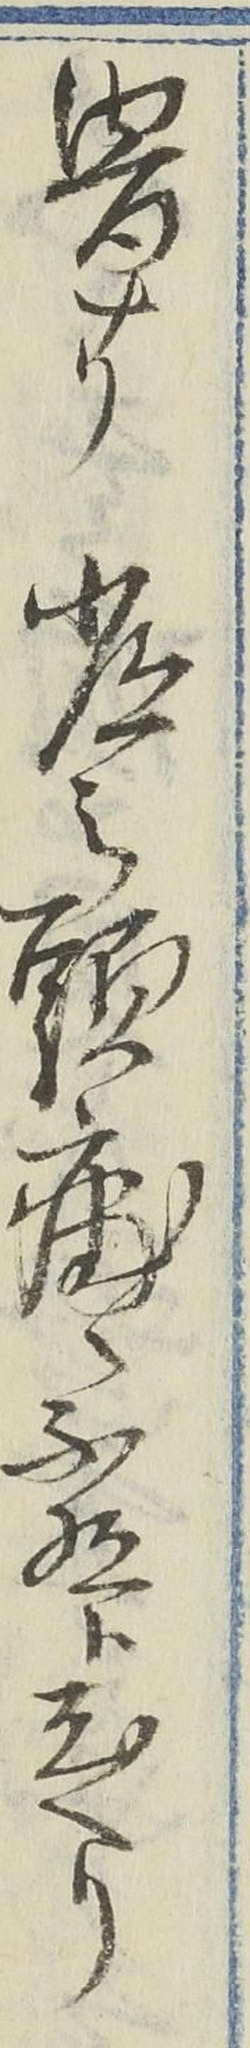骨ナリ常之頭痛ニ不有ト云ヘリ

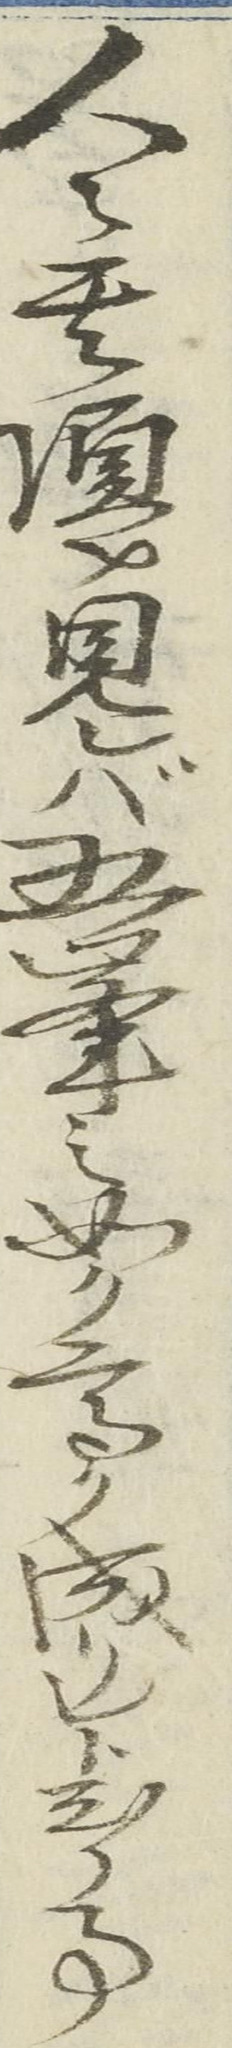人ニ其頂ヲ見レバ五峯之如ク髙ク成リシト云ウ事
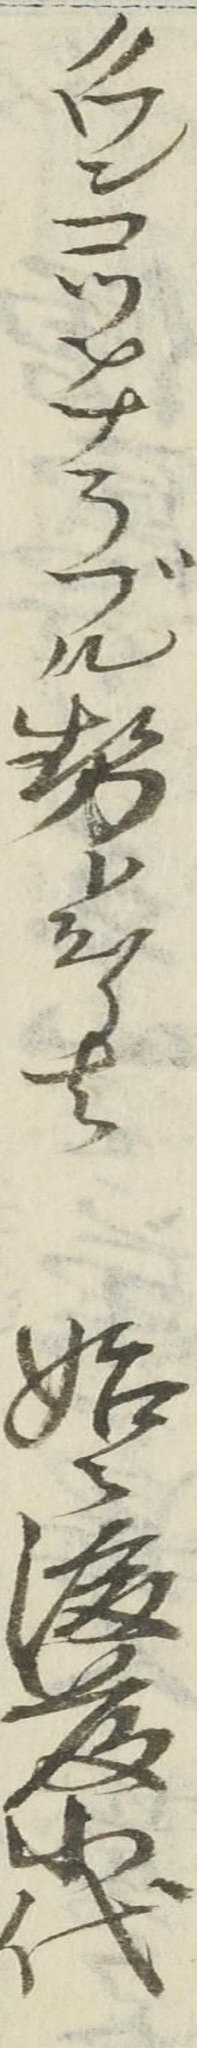クワンコツヲナラブル勢ト云ウハ始ニ後藤小代
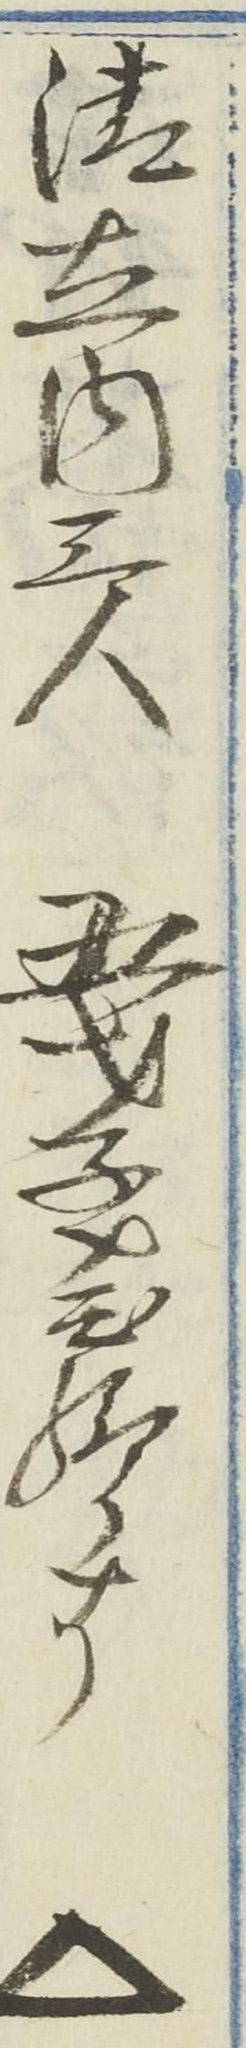清立内三人五才子ヲ云給ウナリ△
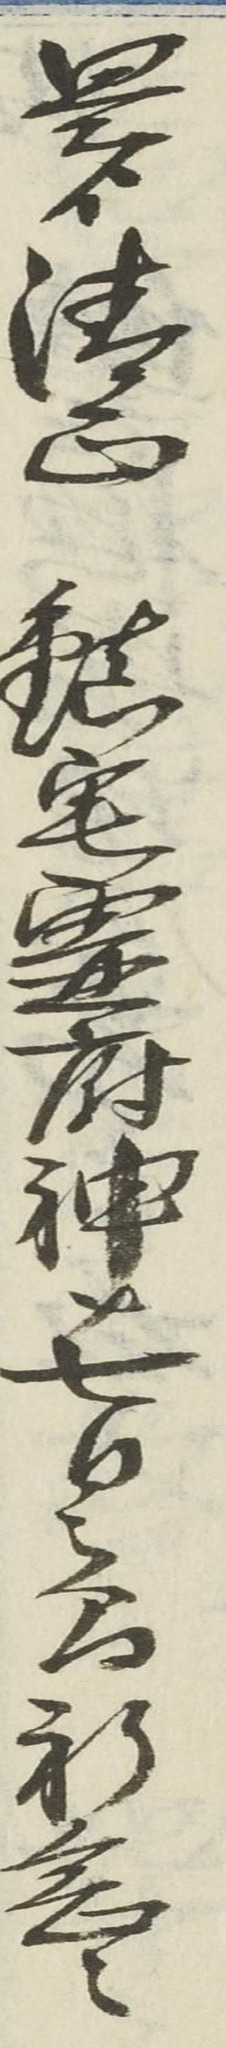是ゟ清正鎮宅霊府神ヲ七日之間祈念之
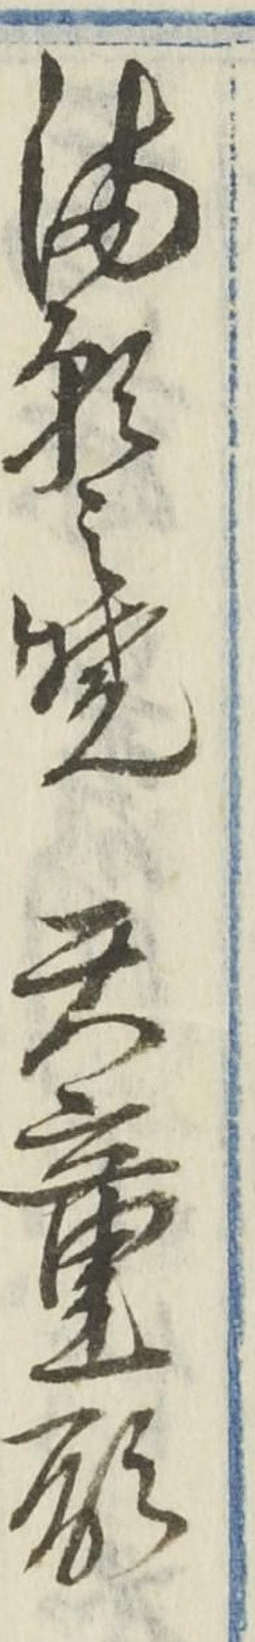満願之暁天童顕
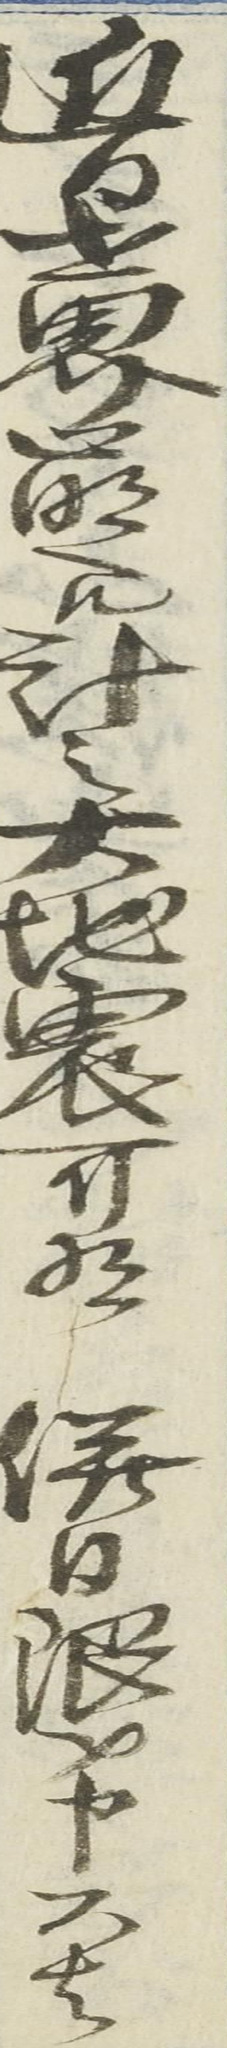近日世界崩へル計之大地震可有併日限ヲ申スは
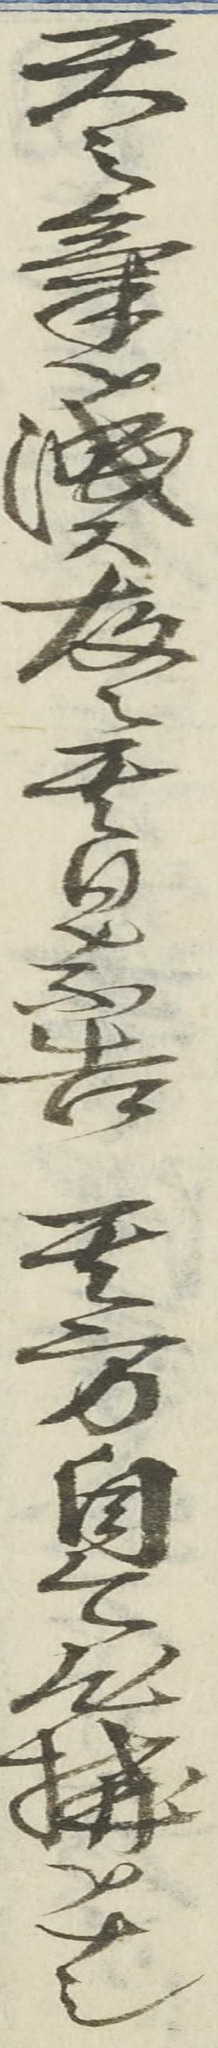天之氣ヲ洩ス故ニ其日ヲ不告其方自今心構ヲナシ
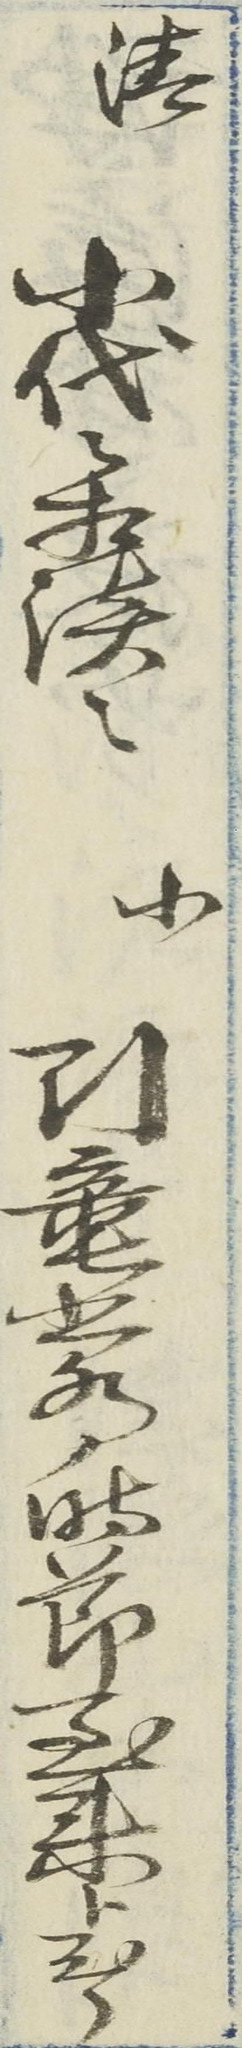清小代ニ相談之小引竜出水ノ時節到来ト云う
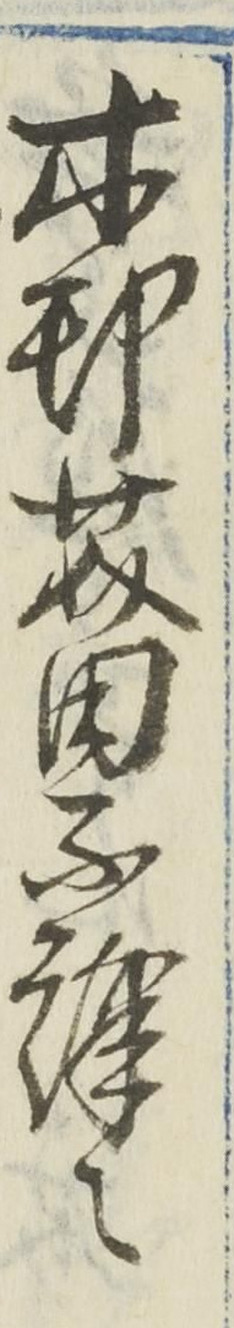木邨芥田不譯之
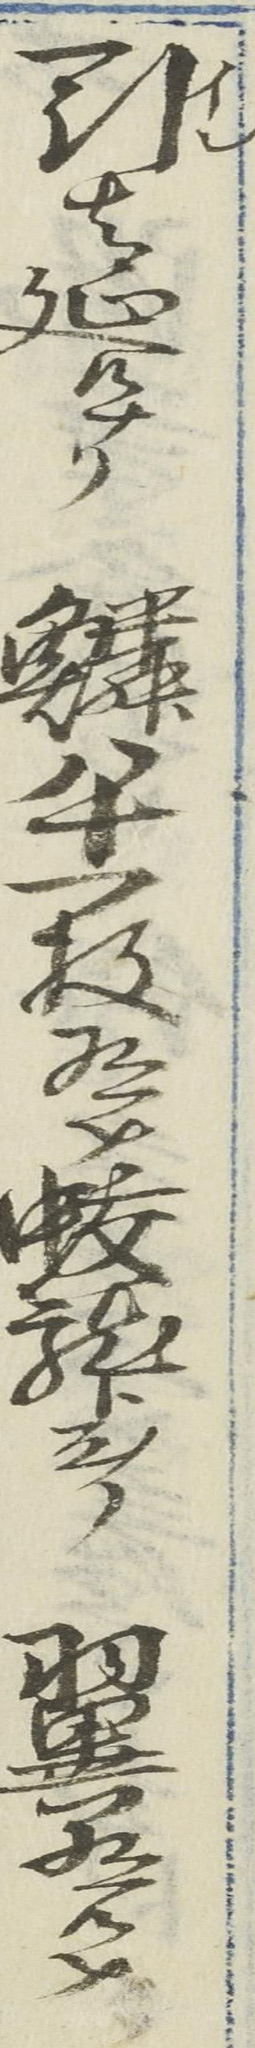引インハ延ルナリ鱗八十一枚有ヲ蛟龍ト云ウ翼有ルヲ
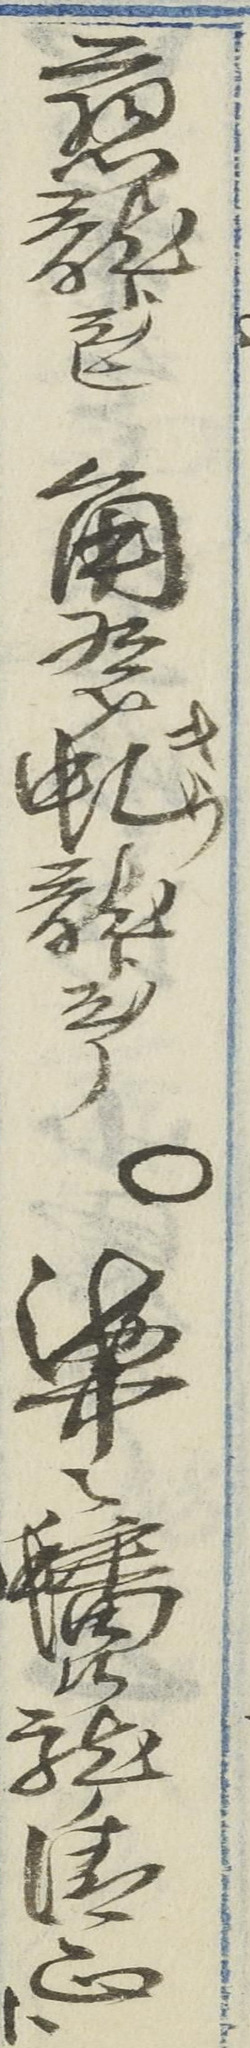應龍ト云ヒ角有ヲ虬キウ龍ト云ウ○海中ニ蟠ル龍ノ清正ト
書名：伏水大地震
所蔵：東京大学地震研究所図書室 Earthquake Research Institute Library, The University of Tokyo, JAPAN
